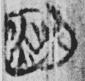○（列）
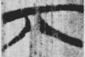亓（其）
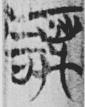○（厲）
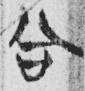同（痛）
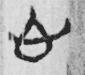心
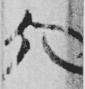六
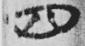四
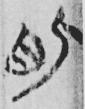艮
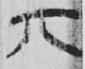亓（其）
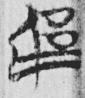躳
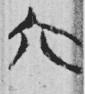六
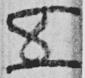五
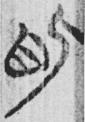艮
